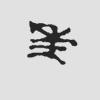秉
